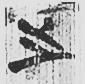之
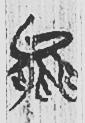能
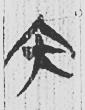內
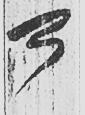乃
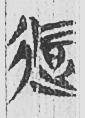{辶石}
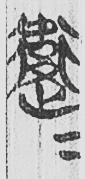衛止=
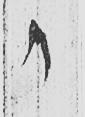人
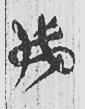弗
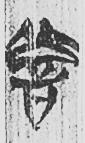善
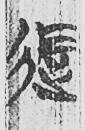{辶石}
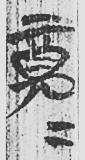奠=
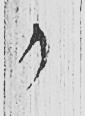人
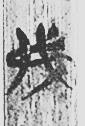弗
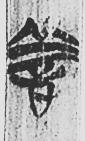善
